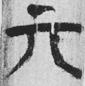亓
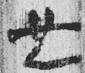也
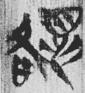鴼（鷺）
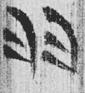羽
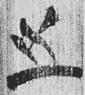之
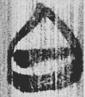白
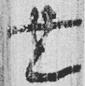也
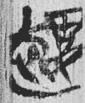○（曾）
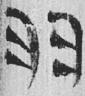羽
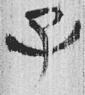子
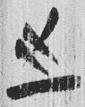之
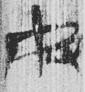奴
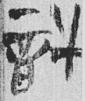訐（衍）
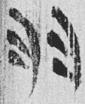羽
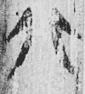北
